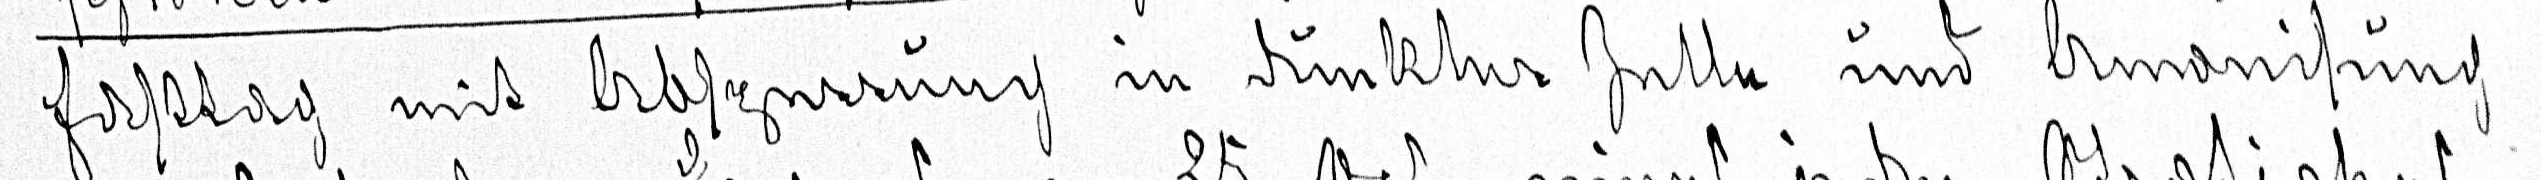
Fasttag mit Absperrung in dunkler Zelle und Amanisung
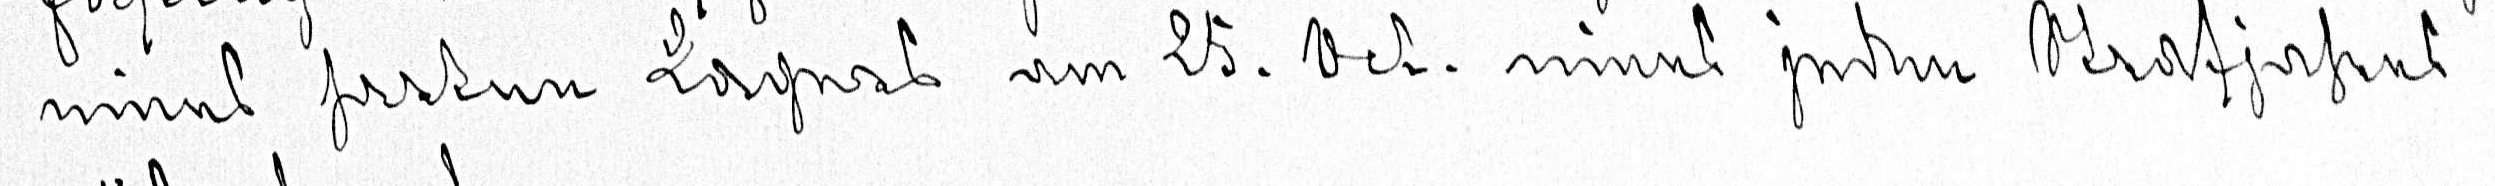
eines harten Lagers am 25. Oct. eines jeden Strafjahres
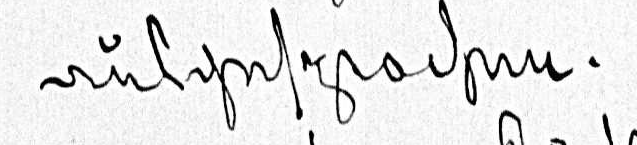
ausgesprochen.
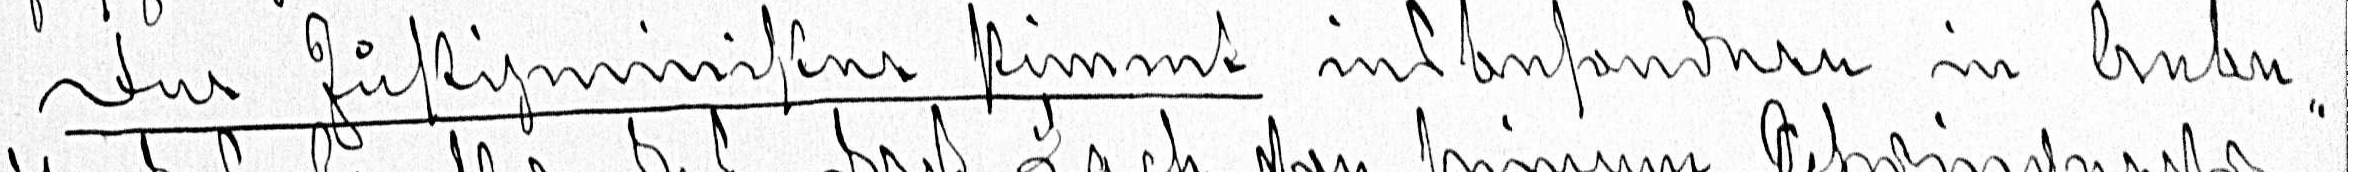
Der Justizminister stimmt insbesondere in Anbe¬
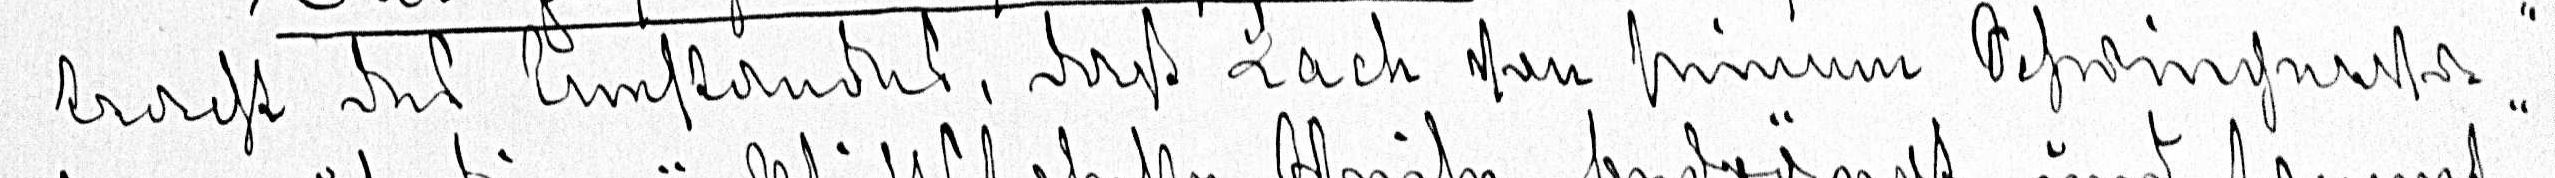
tracht des Umstandes, daß Lach von seinem Schweigerva¬
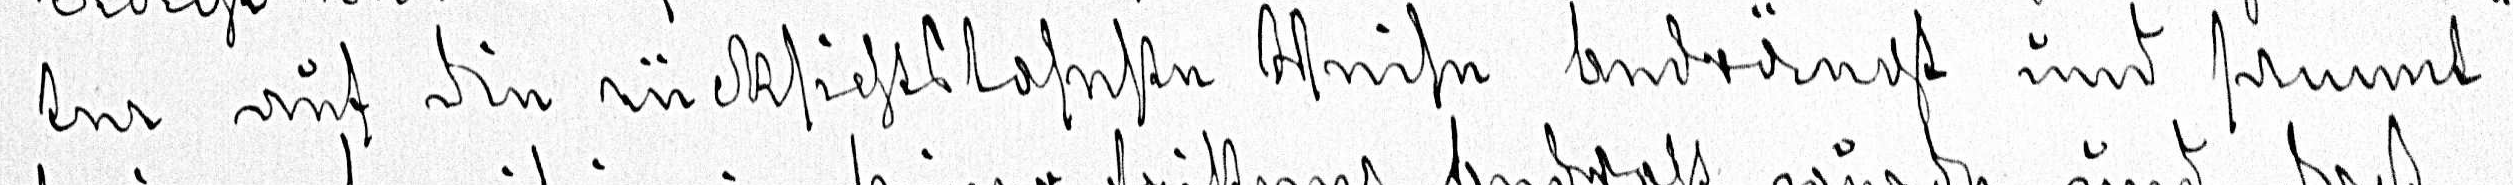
ter auf die rücksichtsloseste Weise bedrängt und sammt
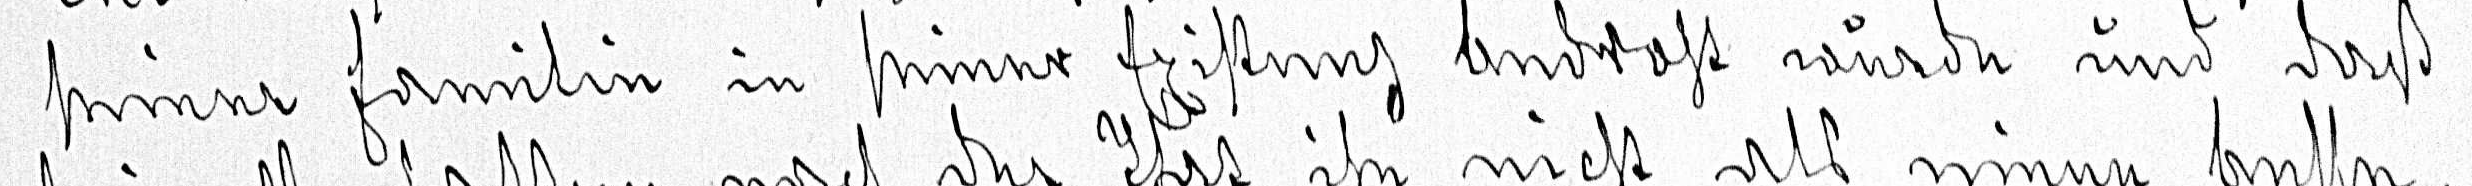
seienr Familie in seiner Existenz bedroht wurde und daß
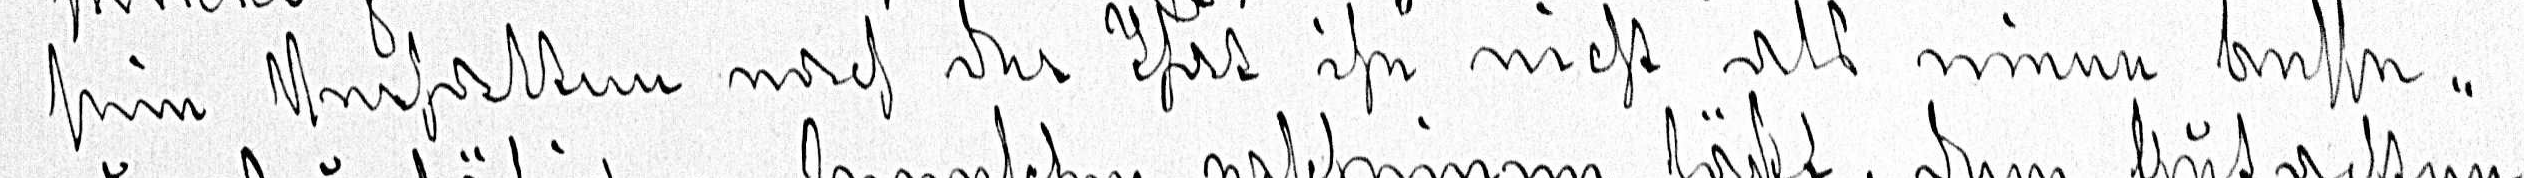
sein Verhalten nach der That ihn nicht als einen besse¬
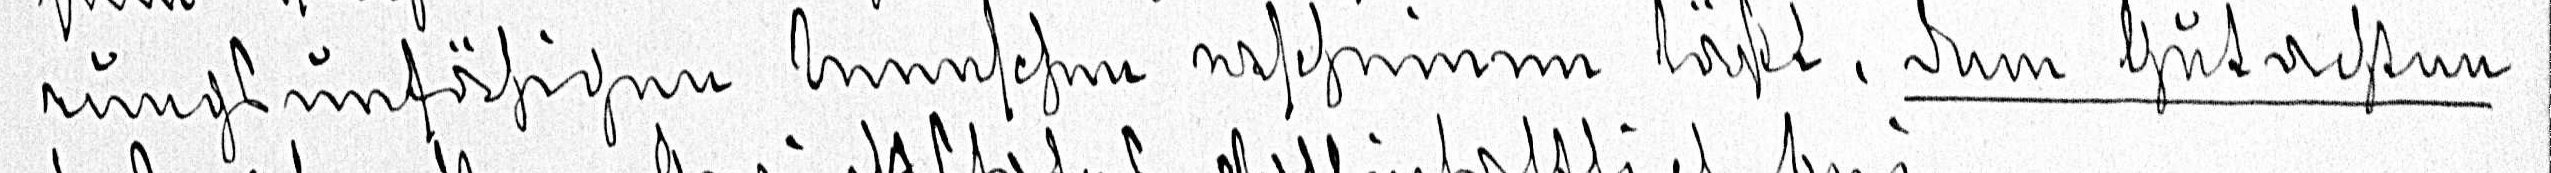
rungsunfähigen Menschen erscheinen läßt, dem Gutachten
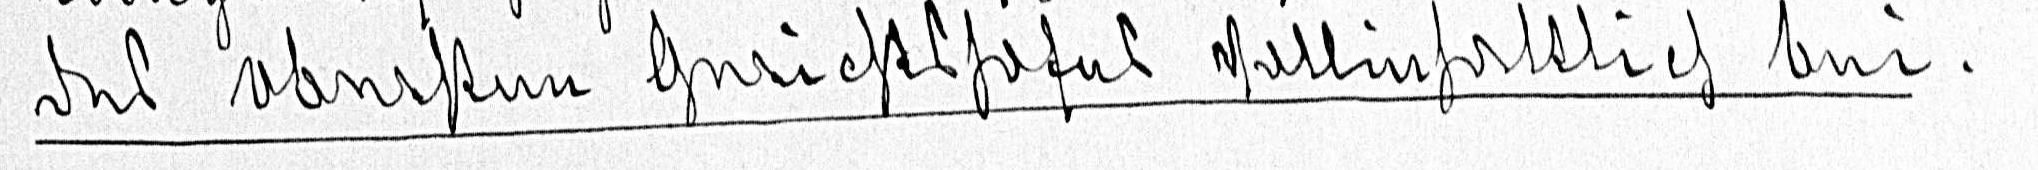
des obersten Gerichts- und Cassationshofes vollinhaltlich bei.
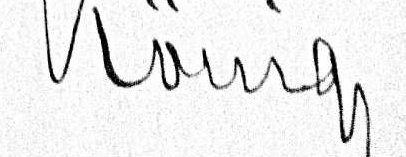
König
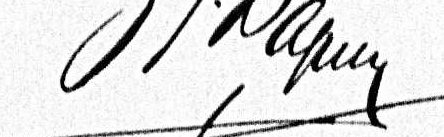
Ges. Papay
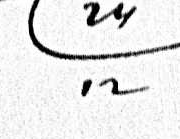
24/12
